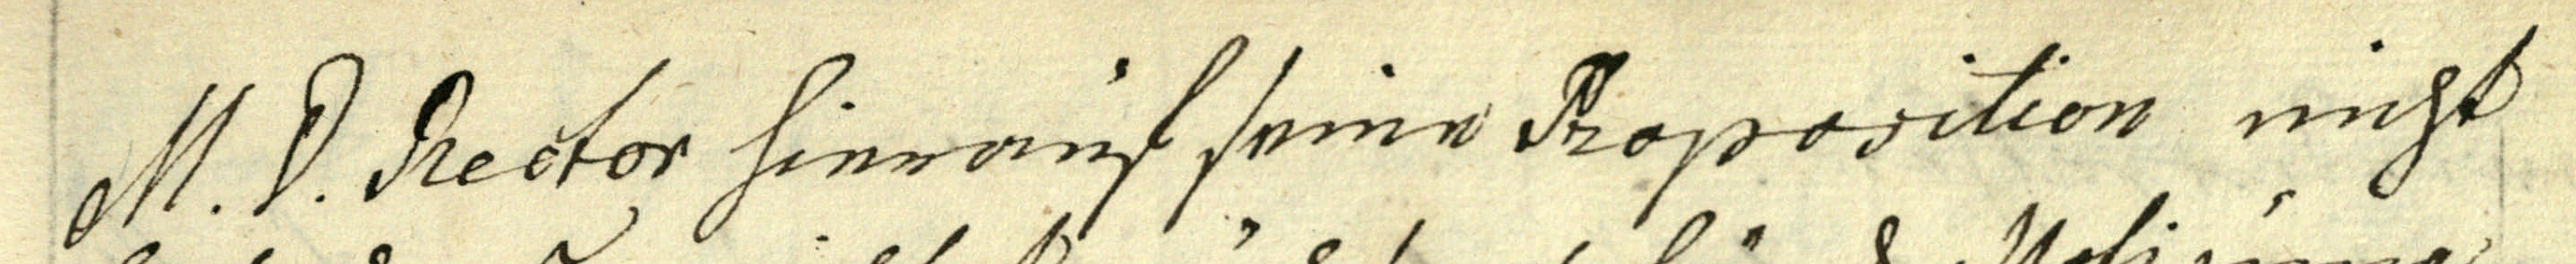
M. D. Rector hierauf seine Proposition nicht
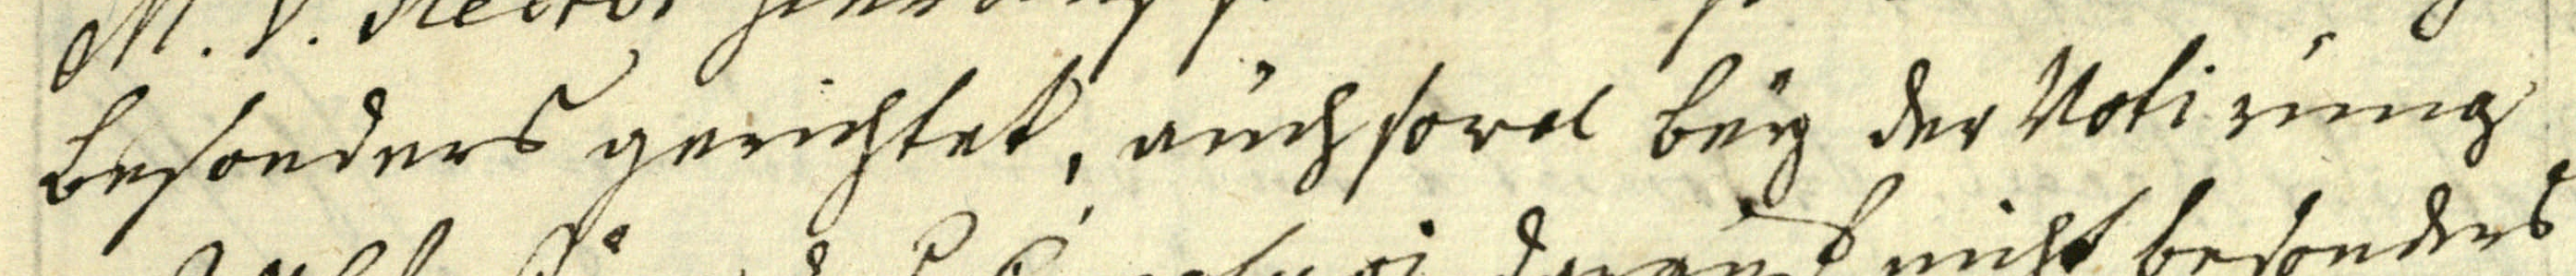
besonders gerichtet, auch sowol beÿ der Votirung
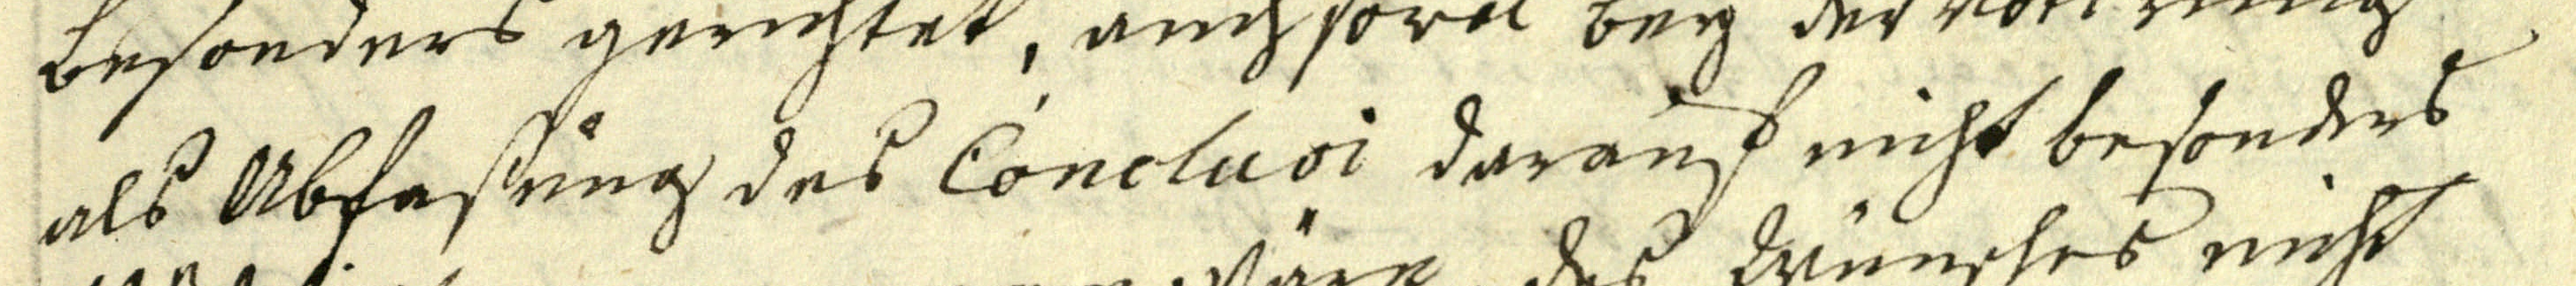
als Abfaßung des Conclusi darauf nicht besonders
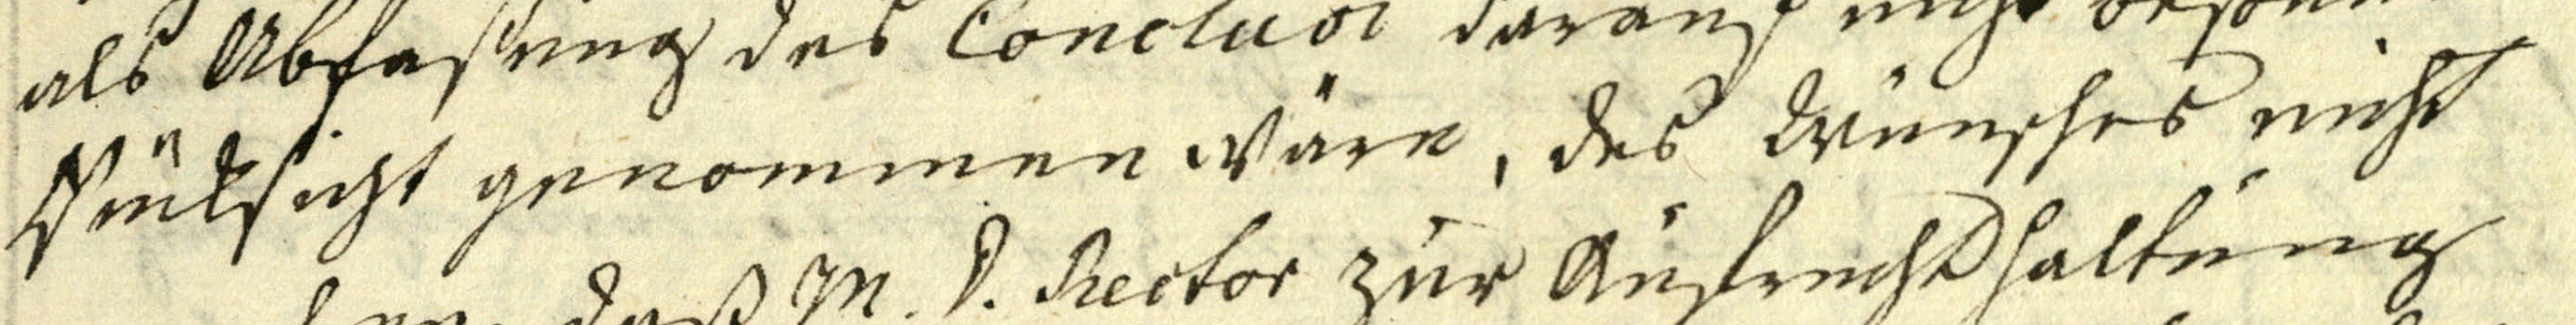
Rücksicht genommen wäre, des Wunsches nicht
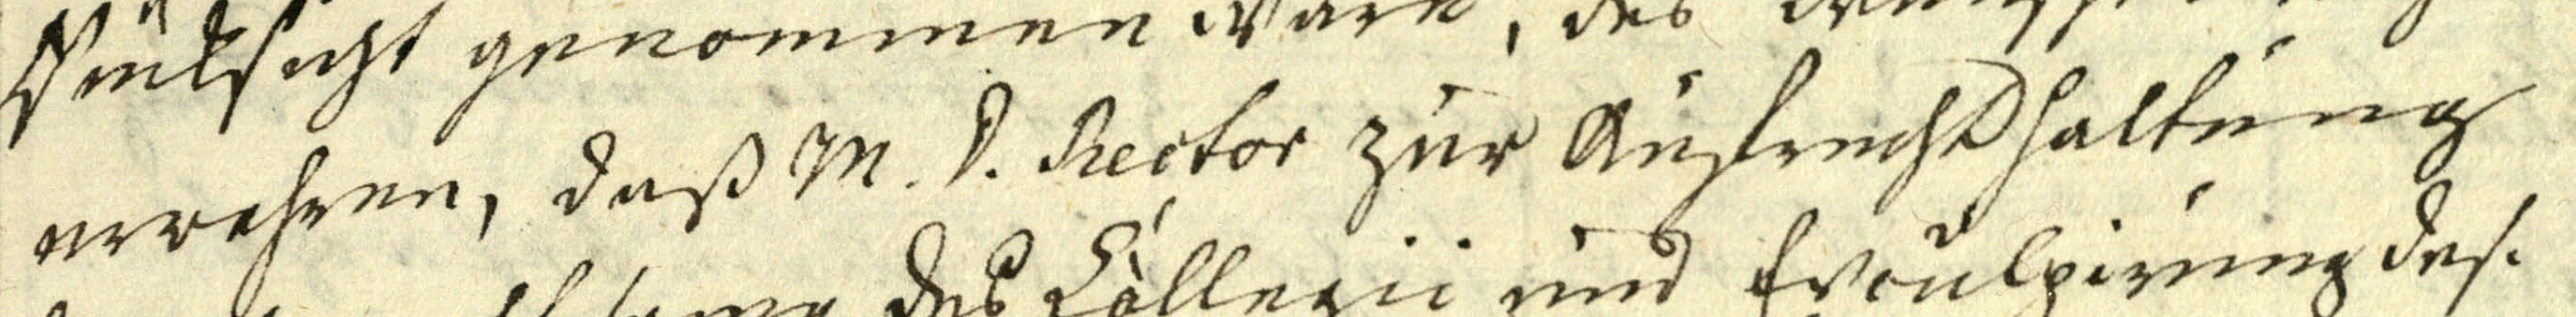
verwehren, daß M. D. Rector zur Aufrechthaltung
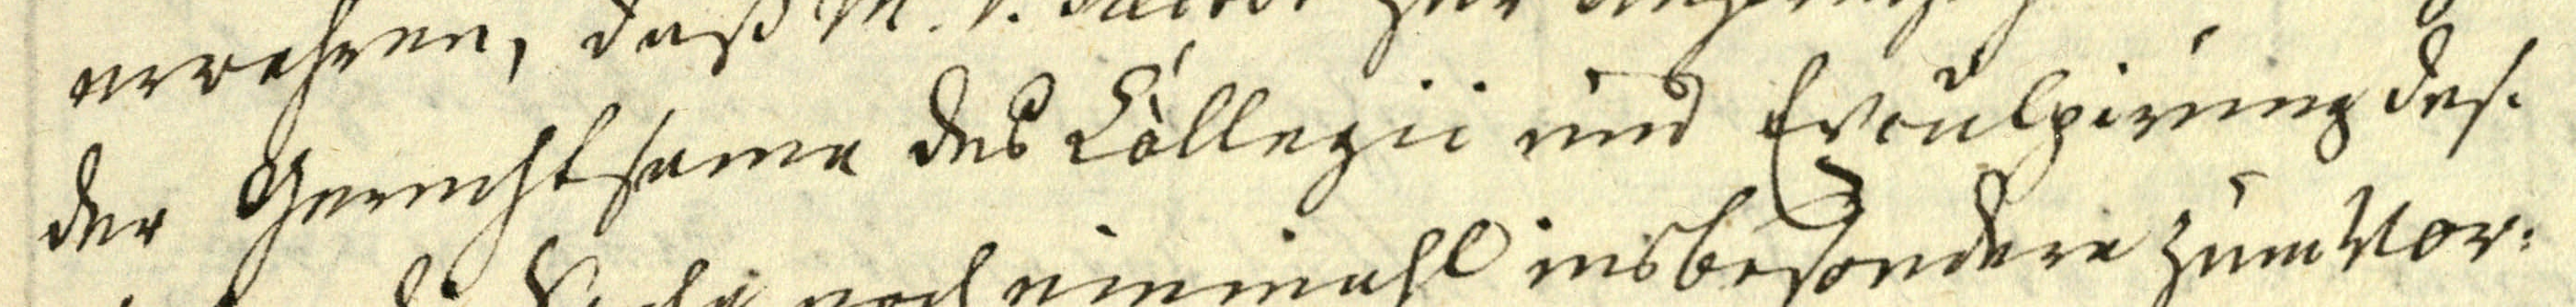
der Gerechtsame des Collegii und Erculpirung des¬
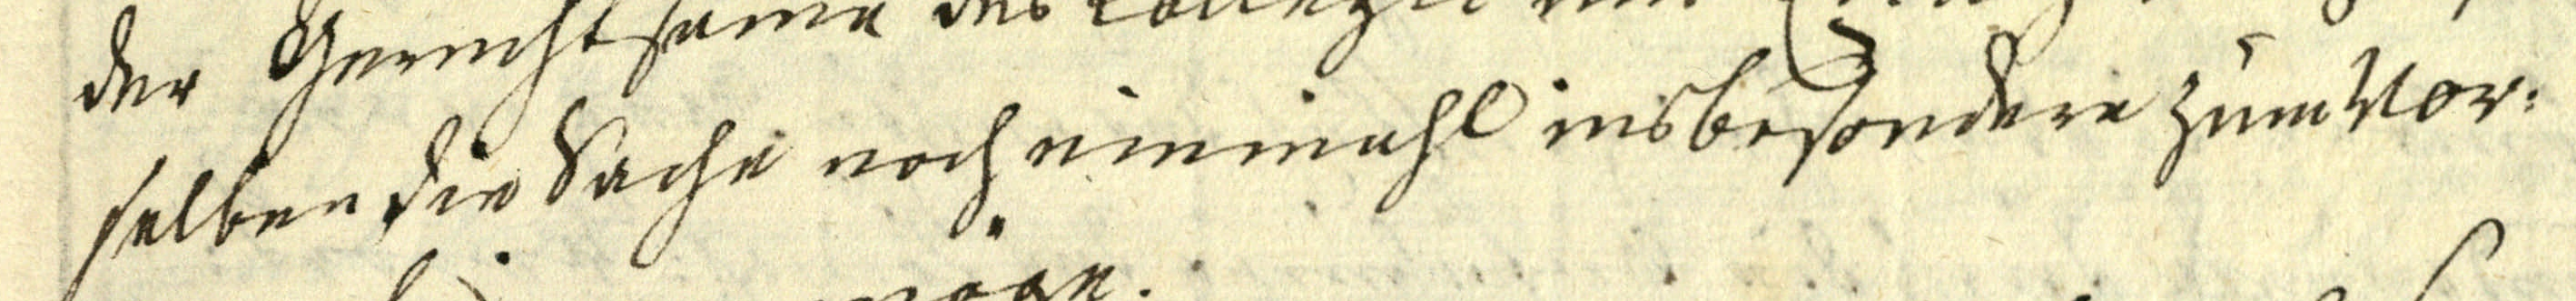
selben die Sache noch einmahl insbesondere zum Vor¬
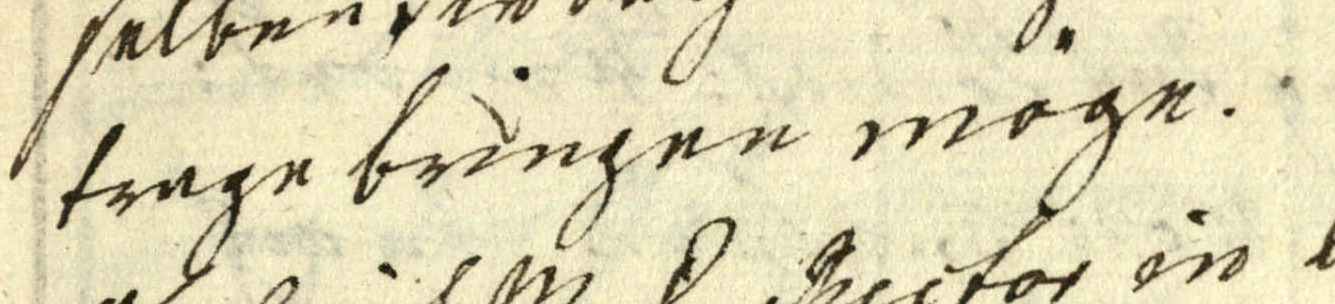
trage bringen möge.
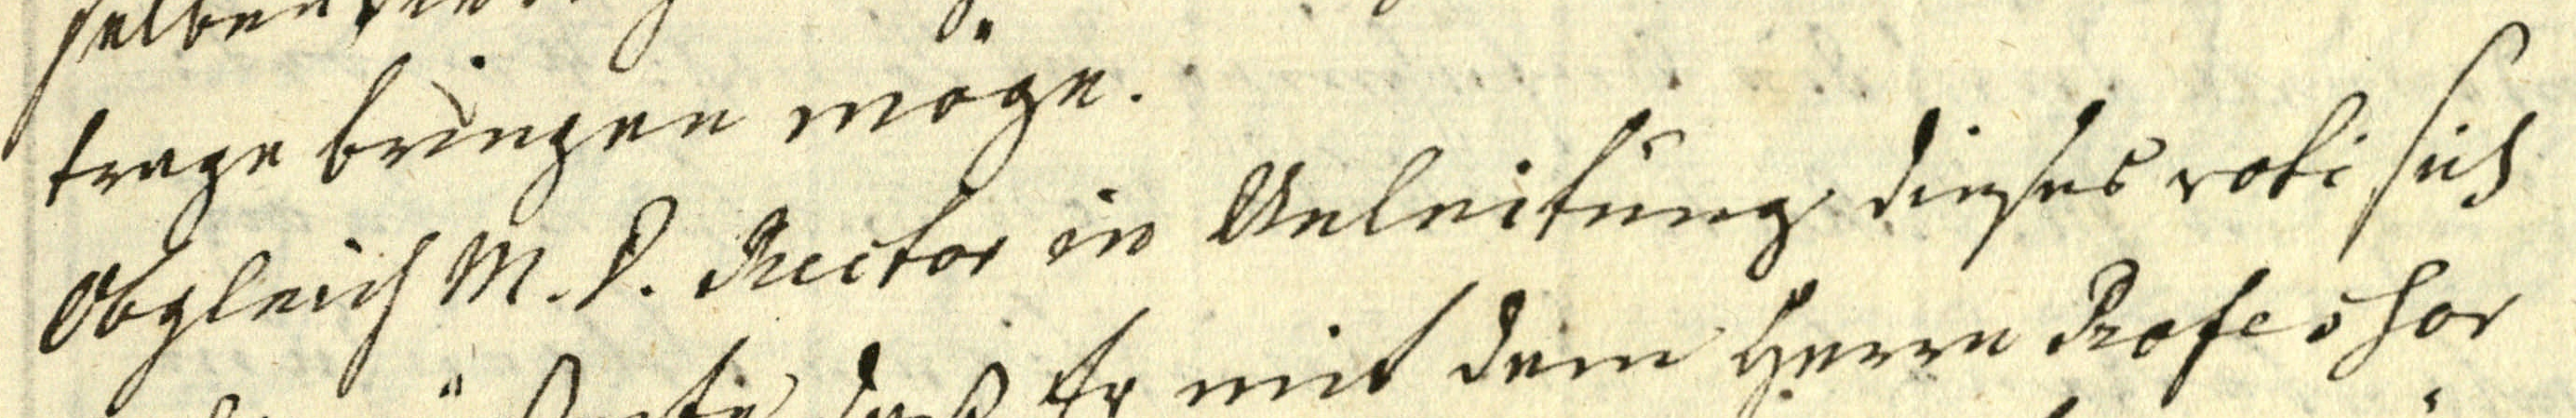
Obgleich M. D. Rector in Anleitung dieses voti sich
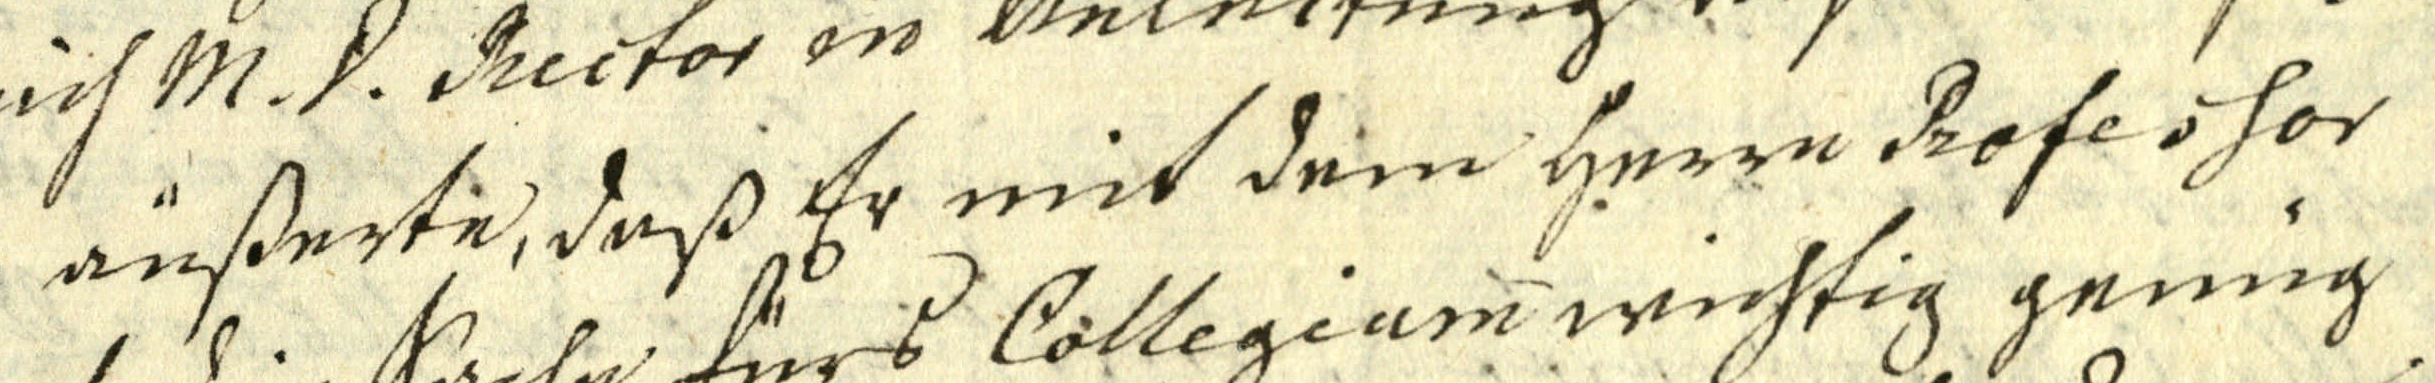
dahin äußerte, daß Er mit dem Herrn Professor
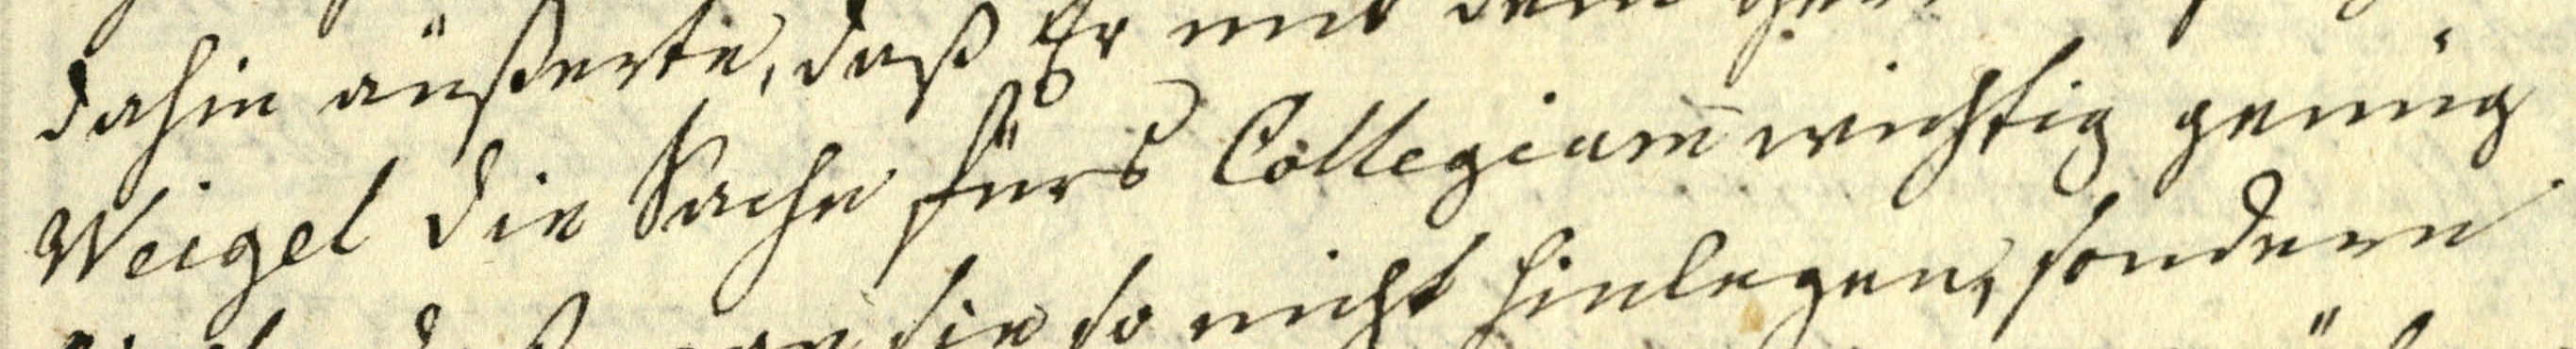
Weigel die Sache fürs Collegium wichtig genug
